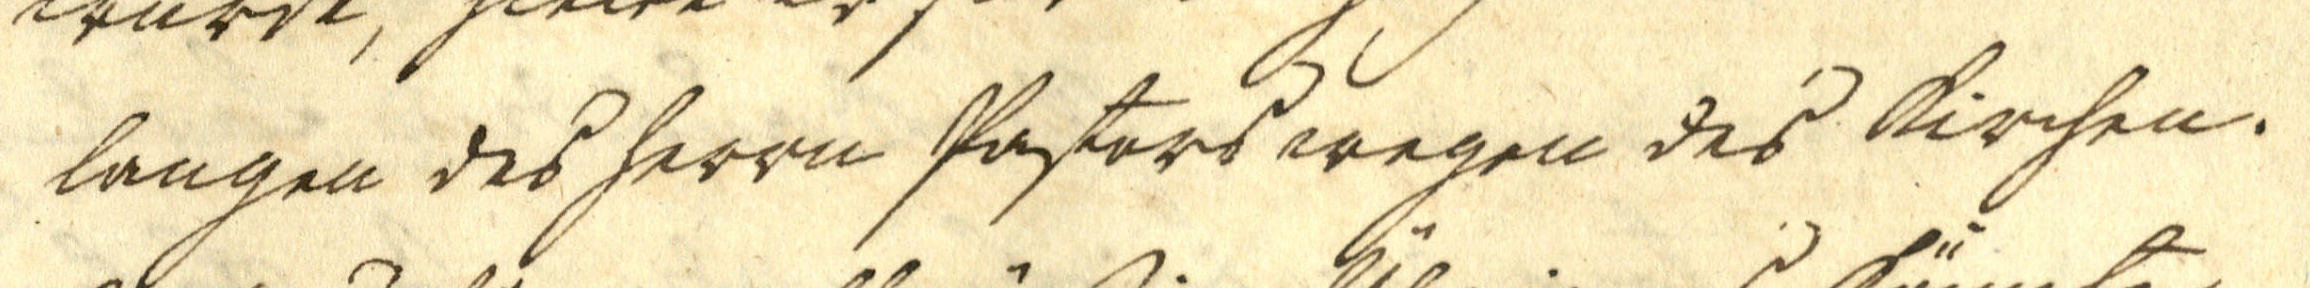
langen des Herrn Pastors wegen des Kirchen¬
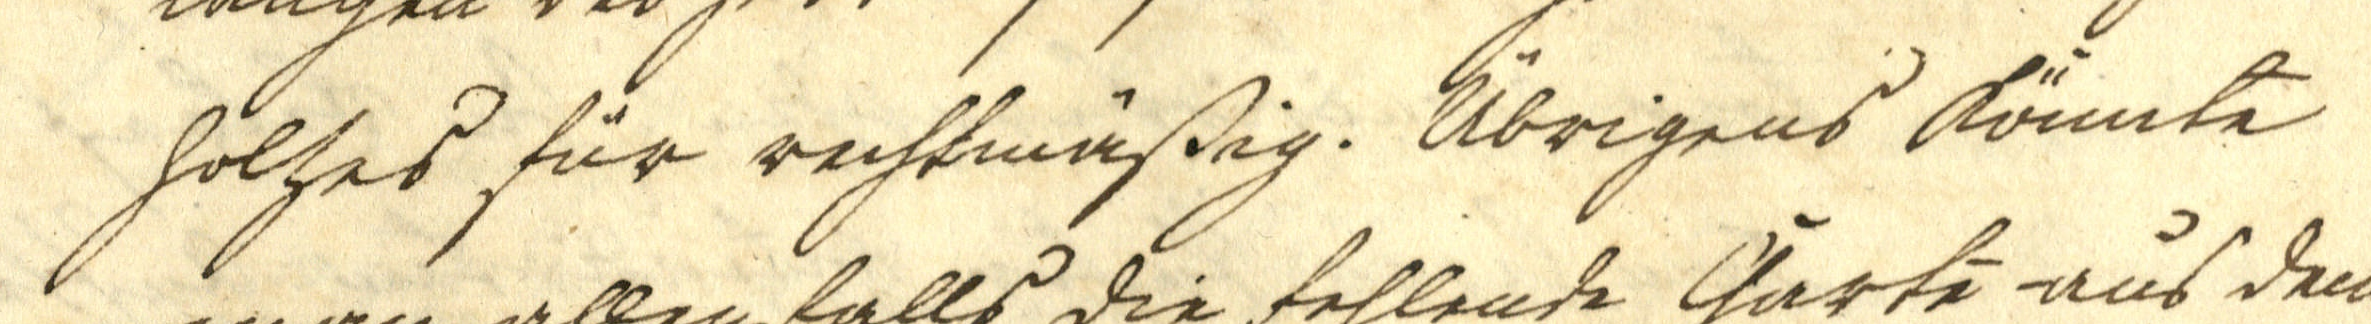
Holzes für rechtmäßig. Übrigens könnte
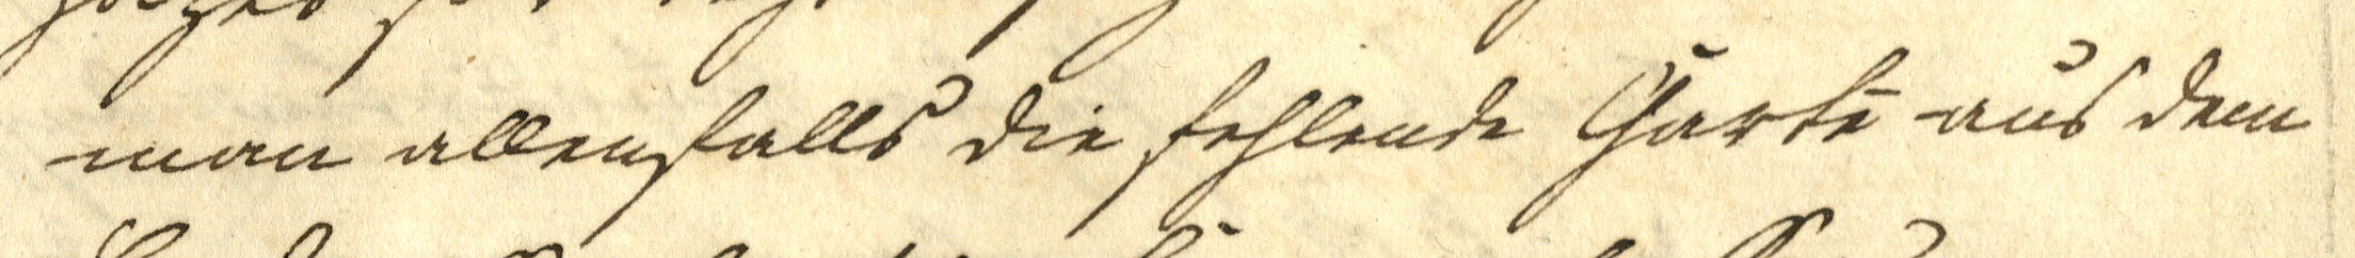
man allenfalls die fehlende Charte aus dem
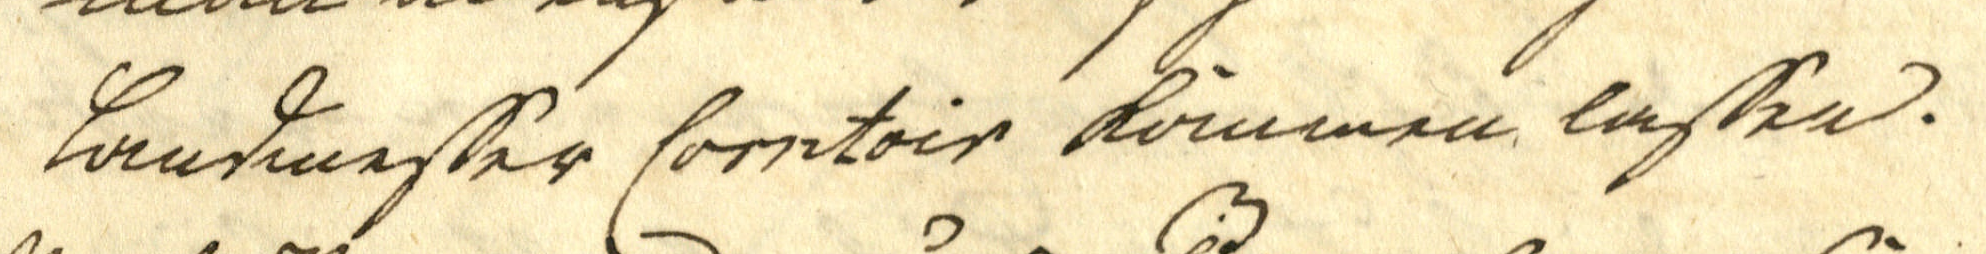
Landmesser Comtoir kommen lassen.
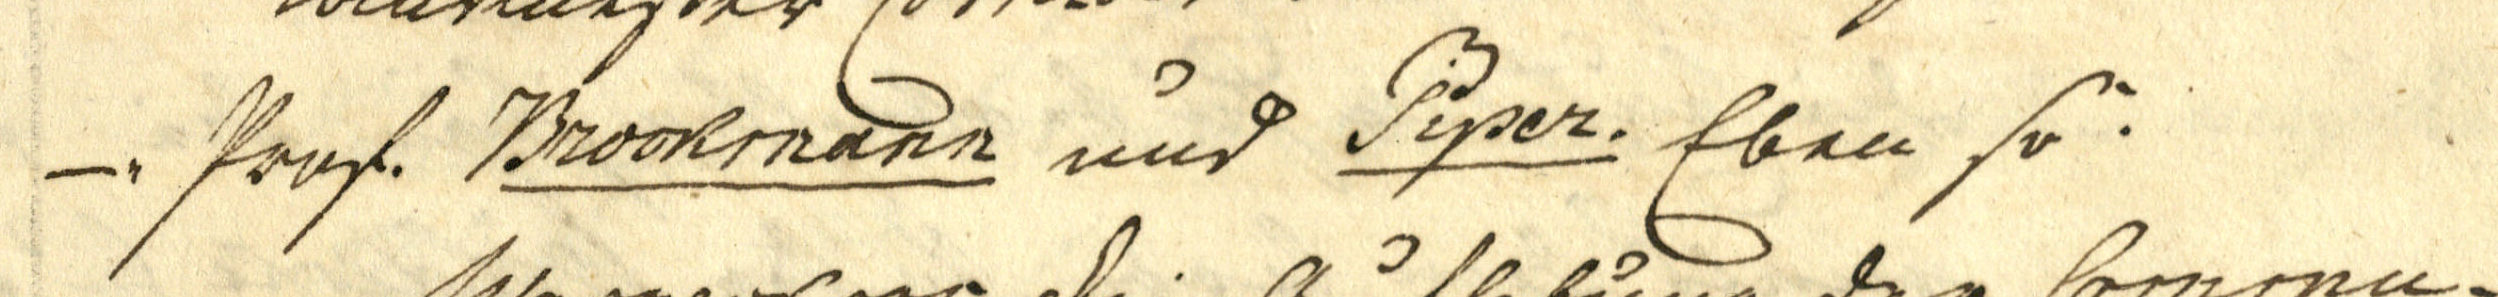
Prof. Brockmann und Piper. Eben so.
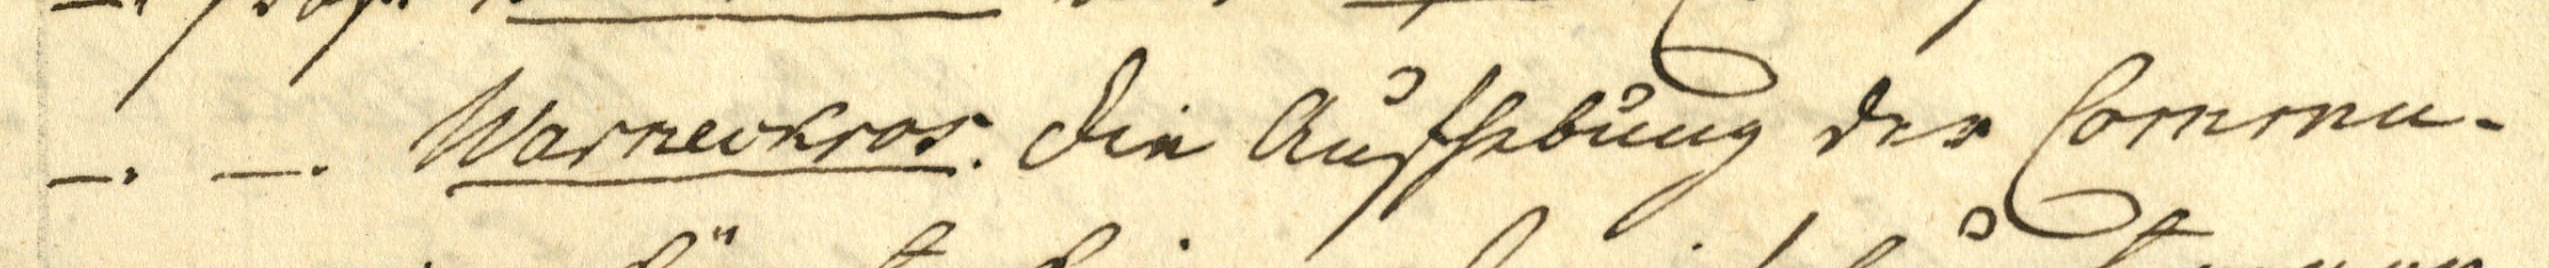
Warneckros. Die Aufhebung der Commun¬
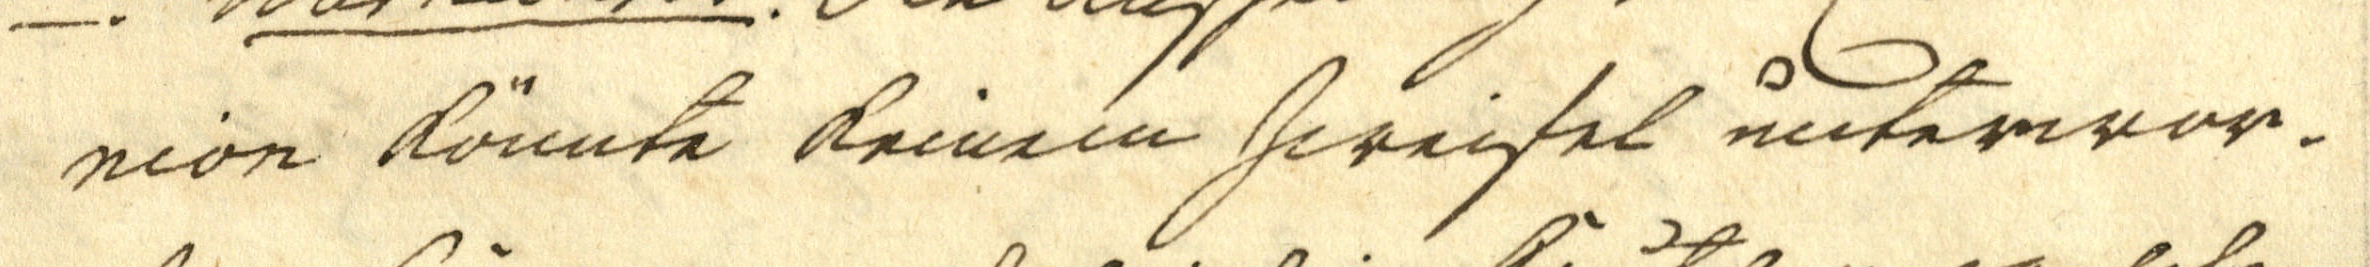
nion könnte keinem Zweifel unterwor¬
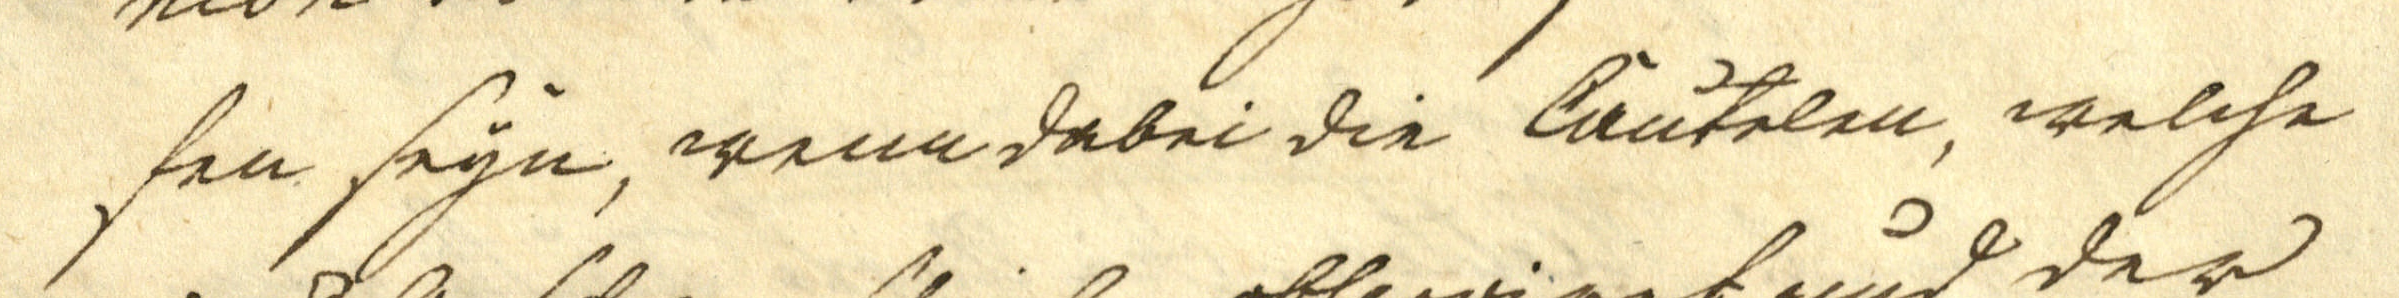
fen seÿn, wenn dabei die Cautelen, welche
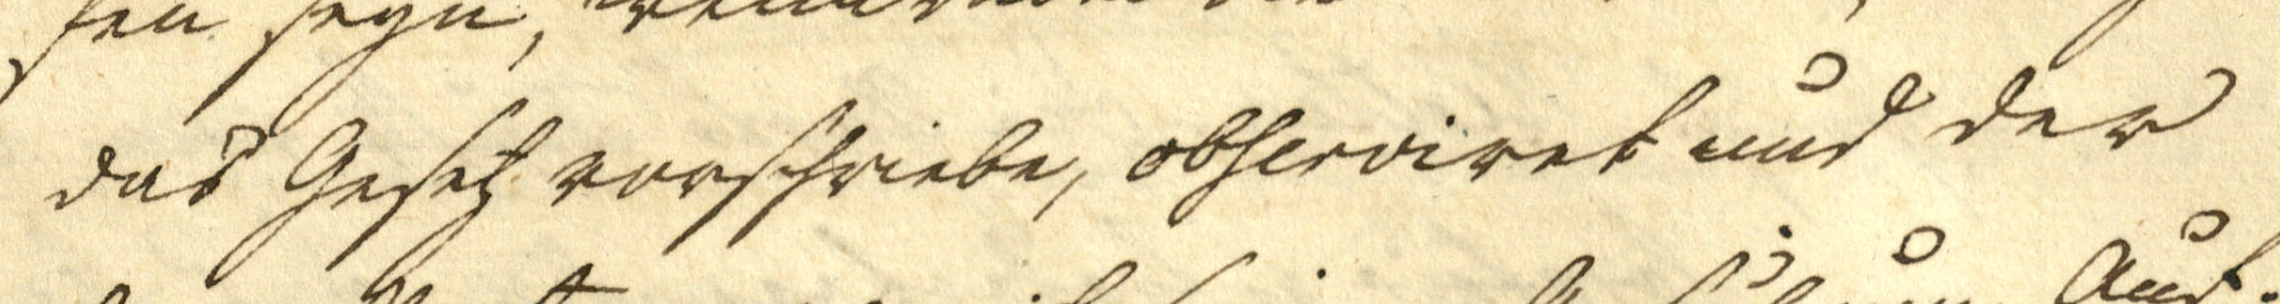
das Gesetz vorschriebe, observiret und der
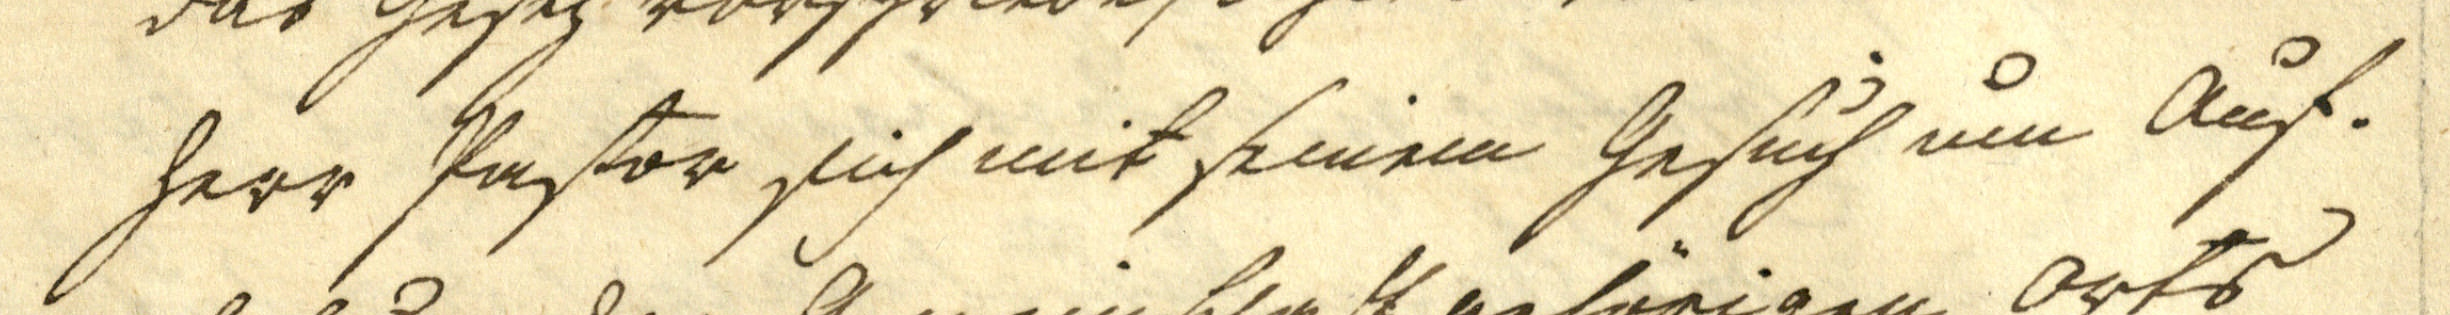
Herr Pastor sich mit seinem Gesuch um Auf¬
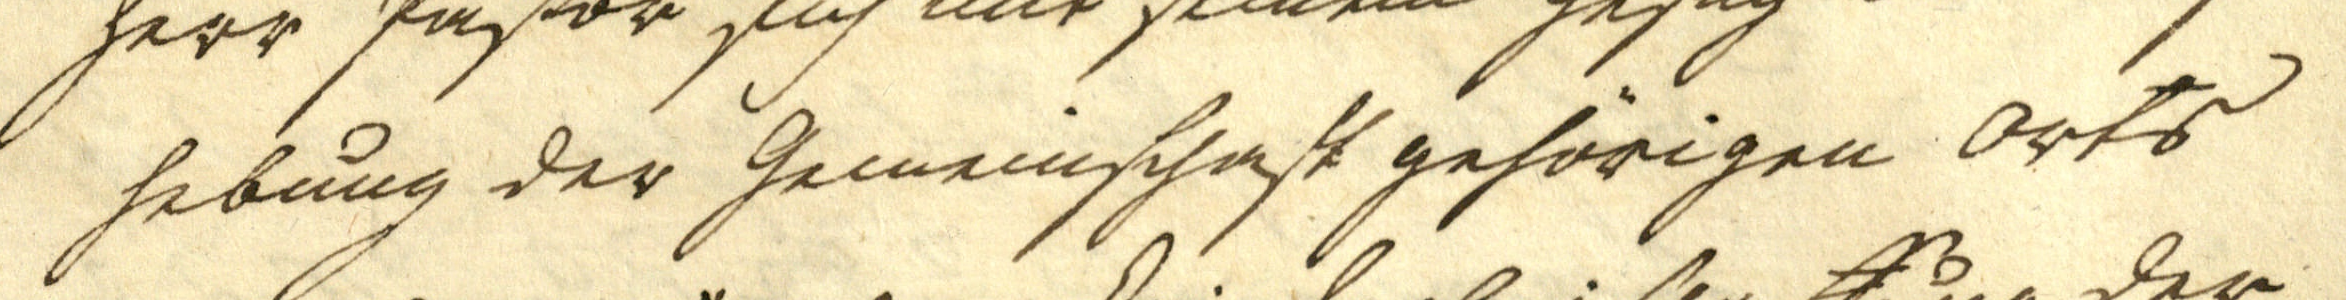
hebung der Gemeinschaft gehörigen Orts
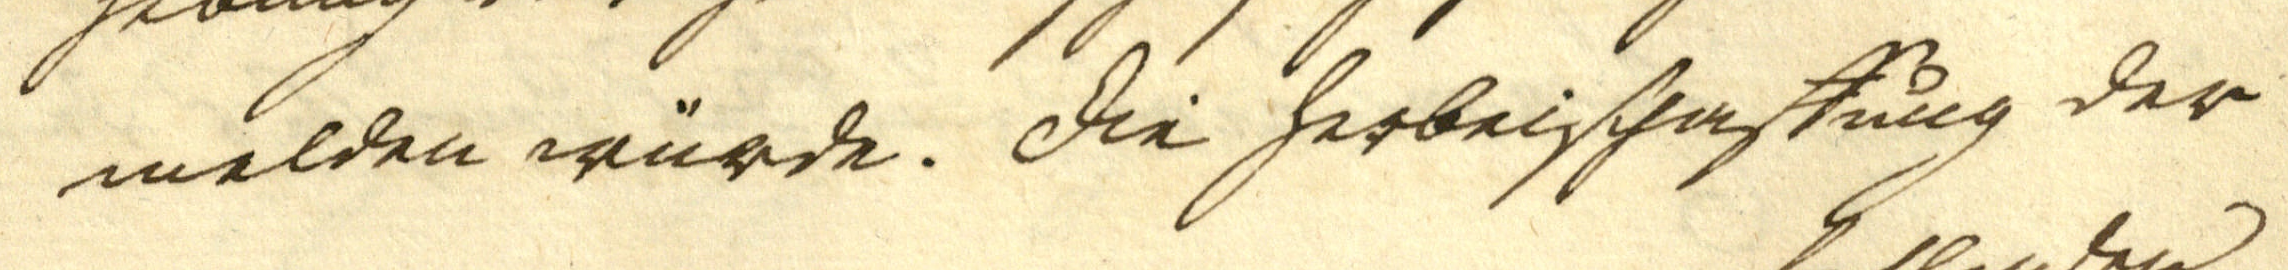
melden würde. Die Herbeischaffung der
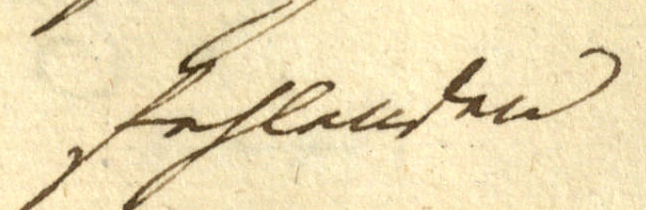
fehlenden
